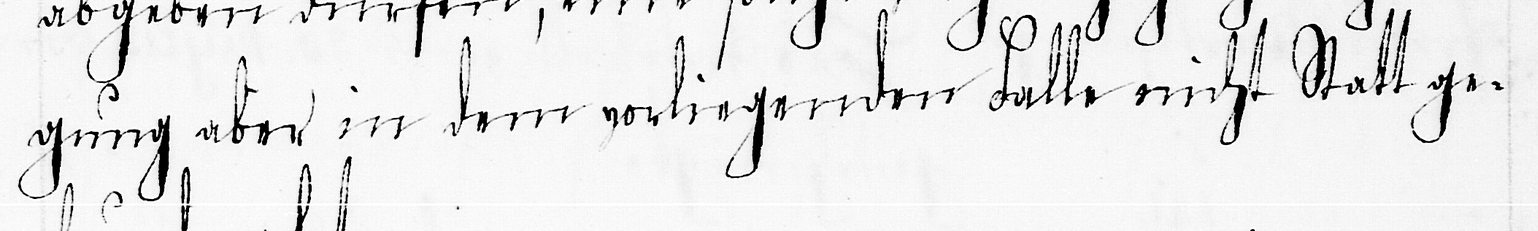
gung aber in dem vorliegenden Falle nicht Statt ge¬
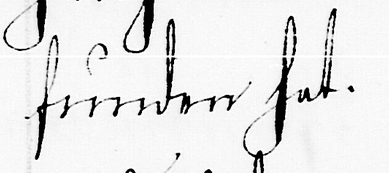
funden hat.
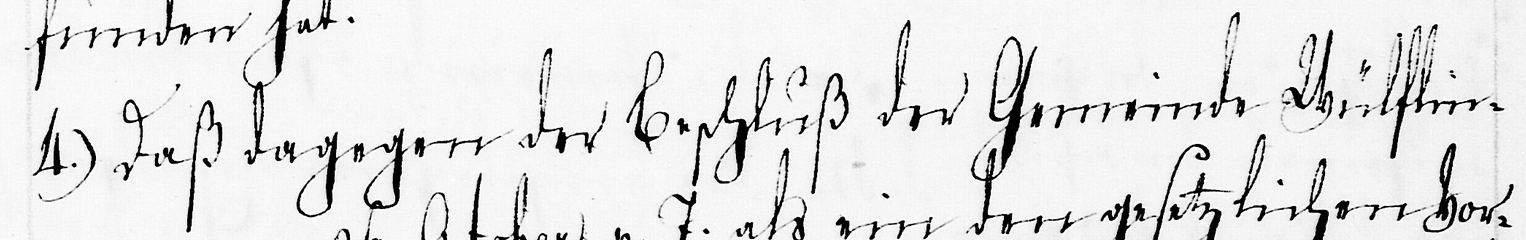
4.) Daß dagegen der Beschluß der Gemeinde Wülflin¬
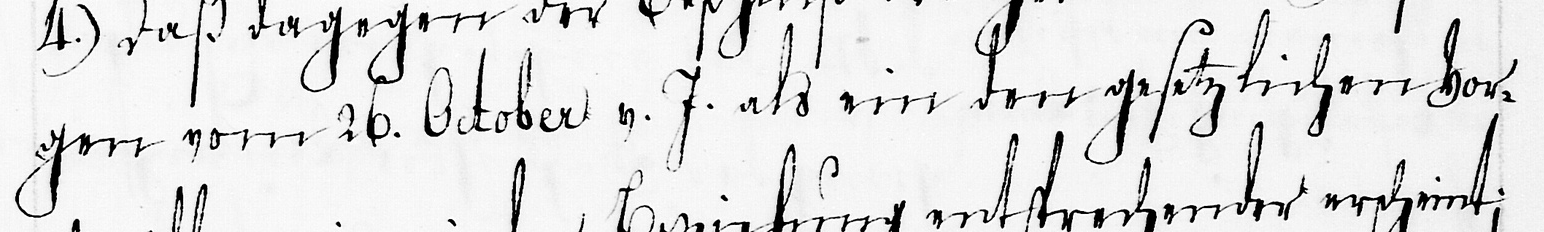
gen vom 26. October v. J. als ein den gesetzlichen Vor¬
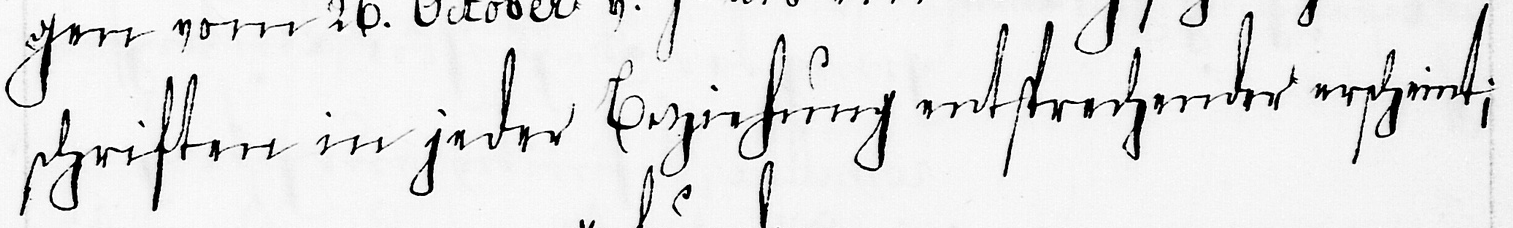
schriften in jeder Beziehung entsprechender erscheint;
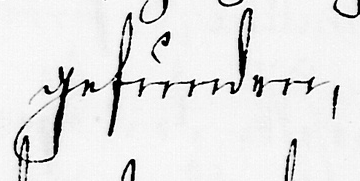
gefunden,
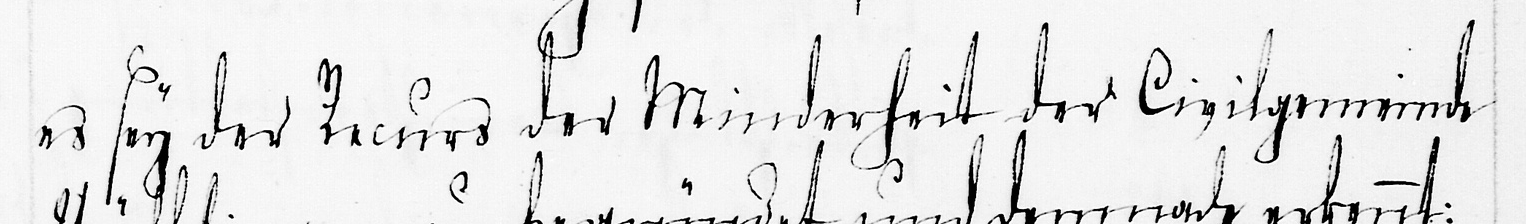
es sey der Recurs der Minderheit der Civilgemeinde
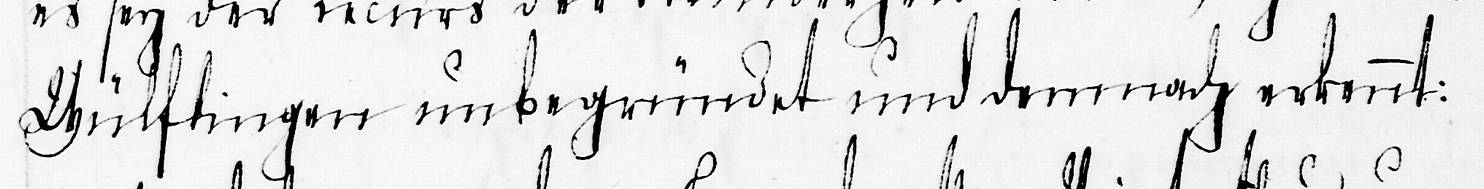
Wülflingen unbegründet und demnach erkennt:
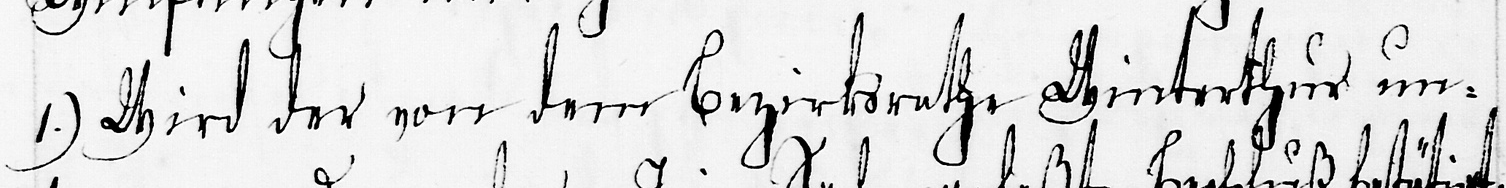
1.) Wird der von dem Bezirksrathe Winterthur un¬
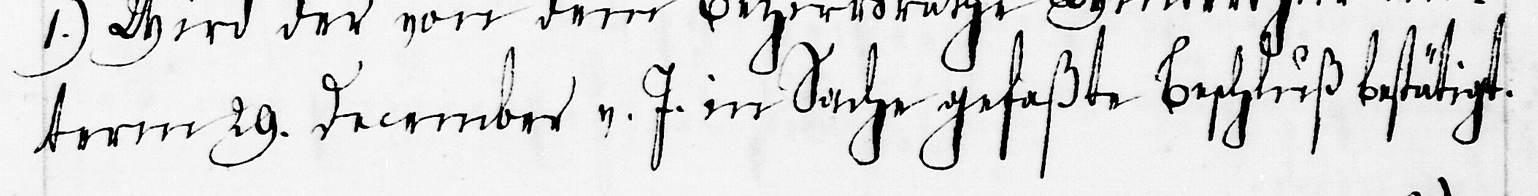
term 29. December v. J. in Sache gefaßte Beschluß bestätigt.
